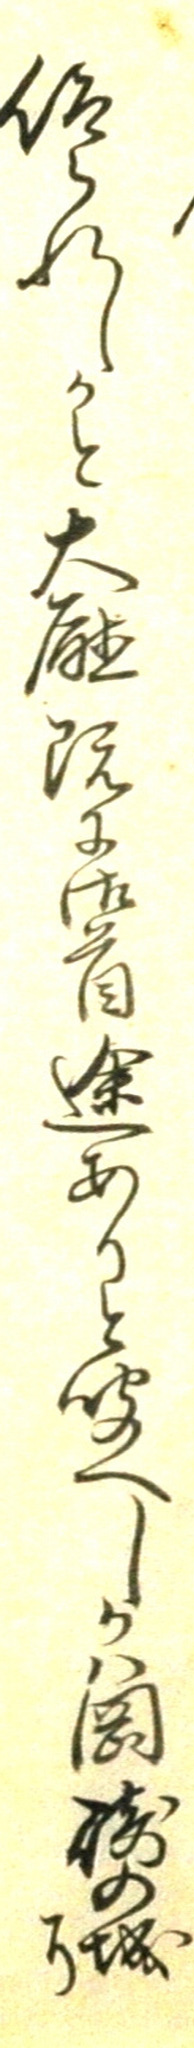仰られしかと大庁既に御首途ありと聞へしかは岡崎の城に
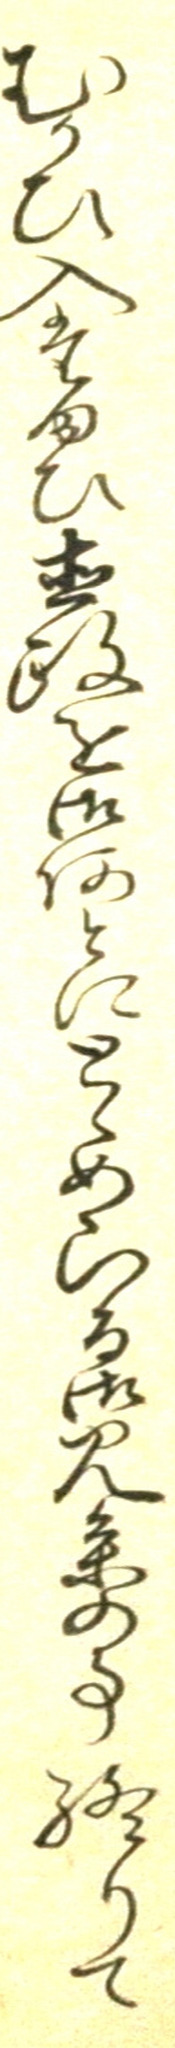むかひ入たまひ直政を御あとにとゝめらる御見参の事終りて
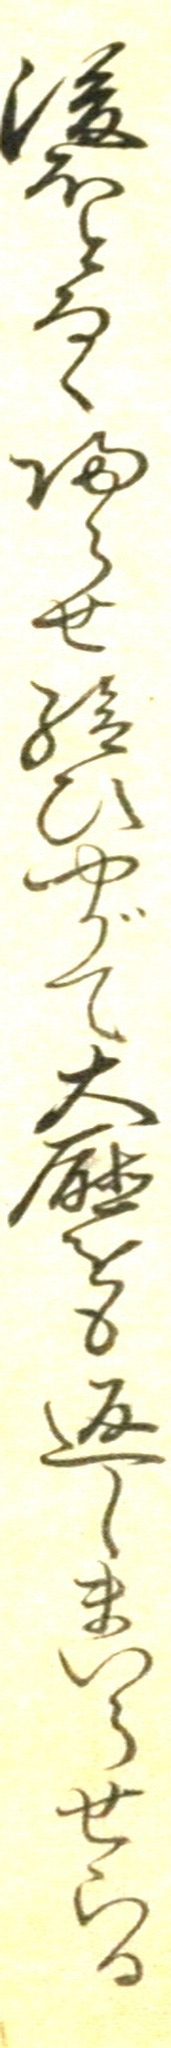後ほとなく帰らせ給ひやがて大庁をも返しまいらせらる
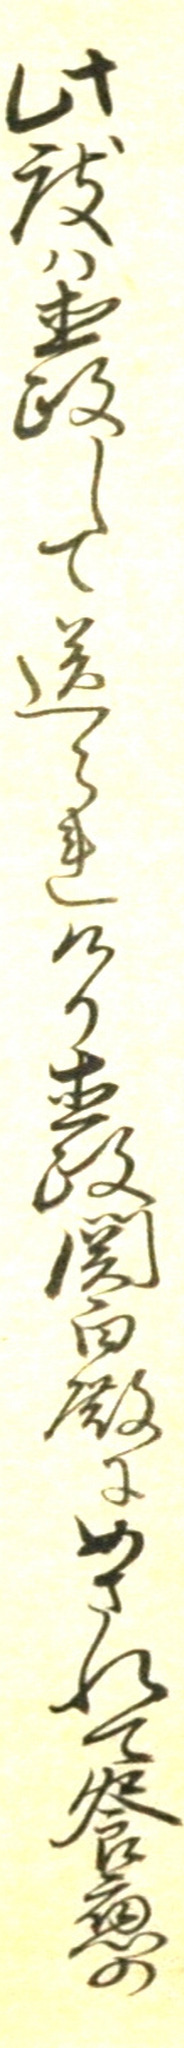此度は直政して送られけり直政関白殿にめされて饗応の
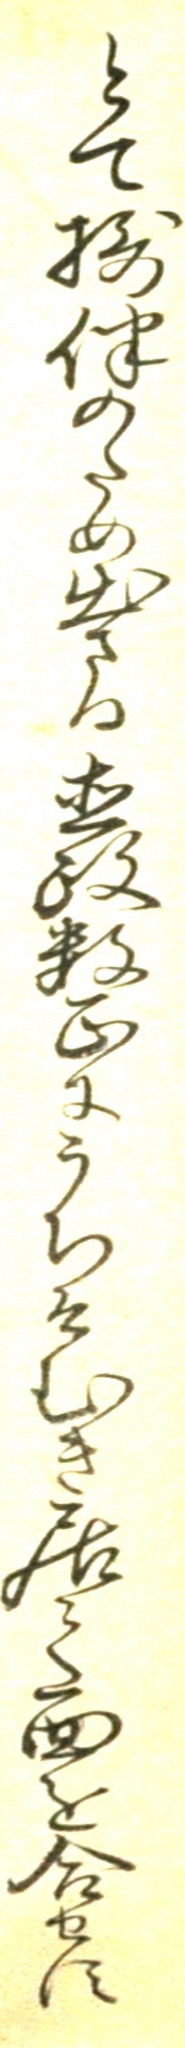とて接伴のため出さる直政数正にうちそむき居て面を合せす
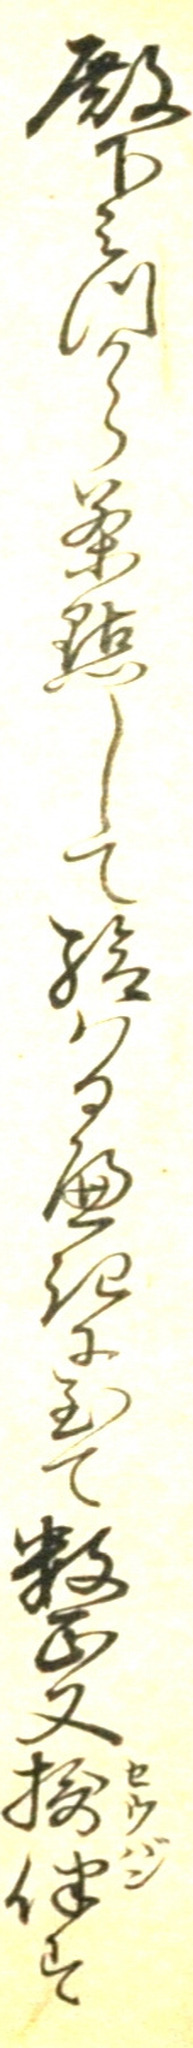殿下みつから茶点して給はるへきに至て数正又接伴す
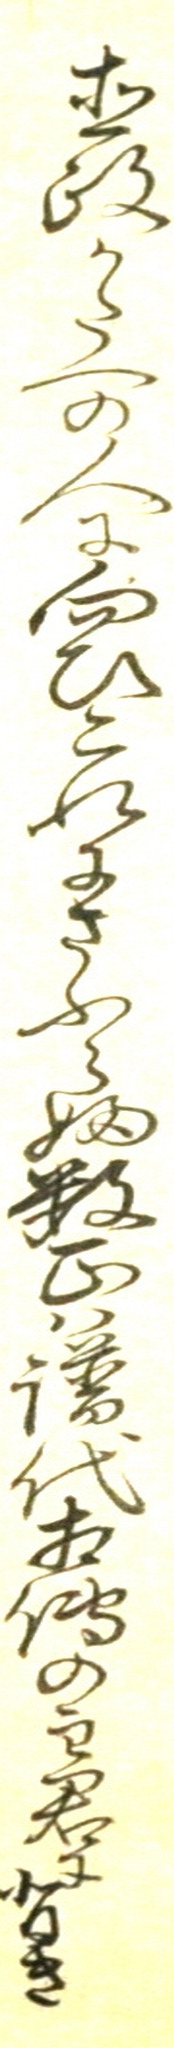直政かたへの人に向ひこれにさふらふ数正は普代相伝の主君に背き
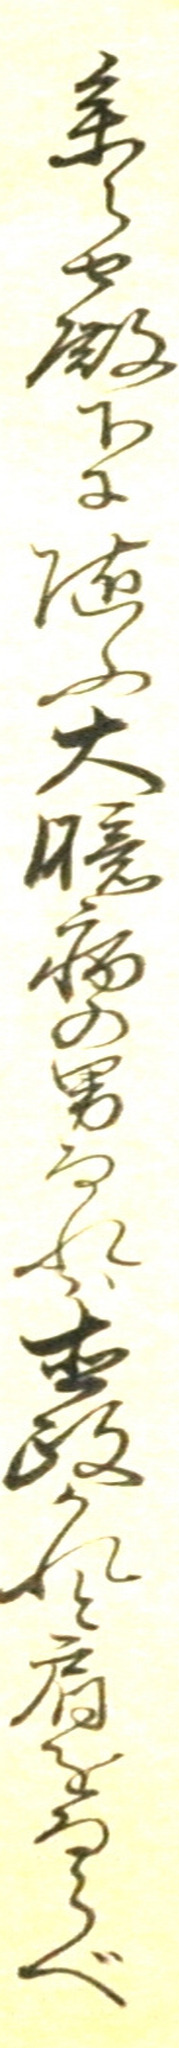参らせ殿下に随ふ大臆病の男なれは直政かれと肩をならべ
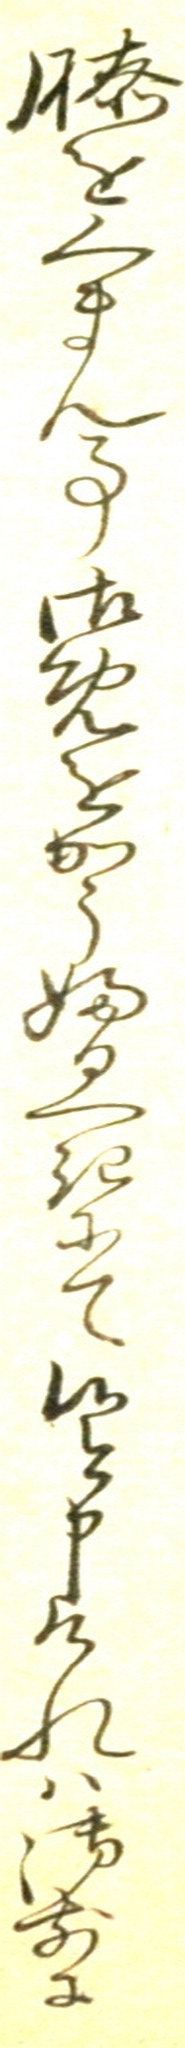膝をくまん事御免をかうふるへきにて候と申けれは御前に
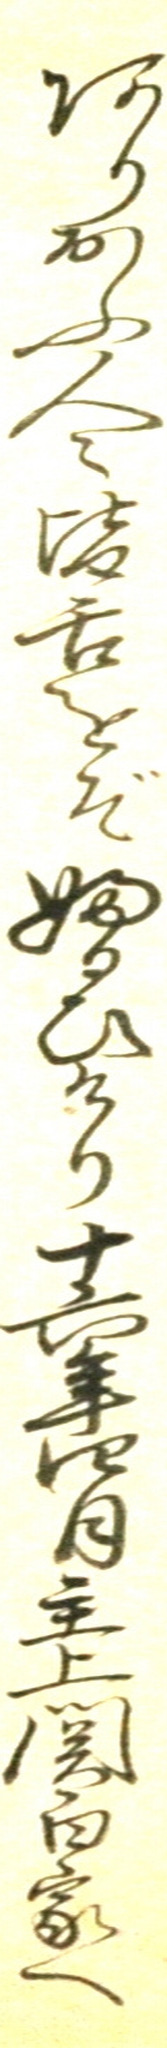ありおふ人々皆舌をぞふるひけり十六年四月主上関白家へ
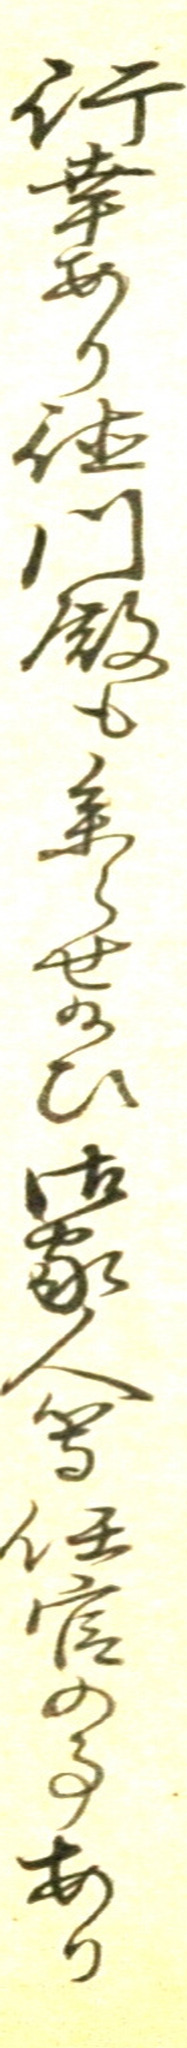行幸あり徳川殿も参らせ給ひ御家人等任官の事あり
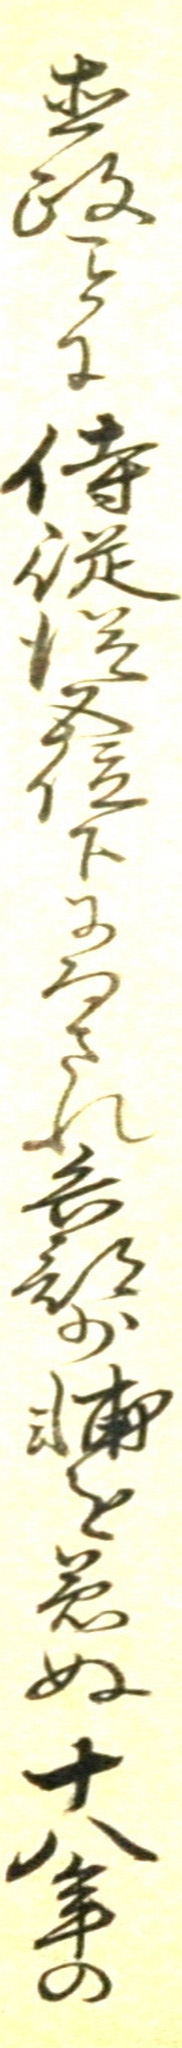直政ことに侍従従五位下になされ兵部少輔を着ぬ十八年の
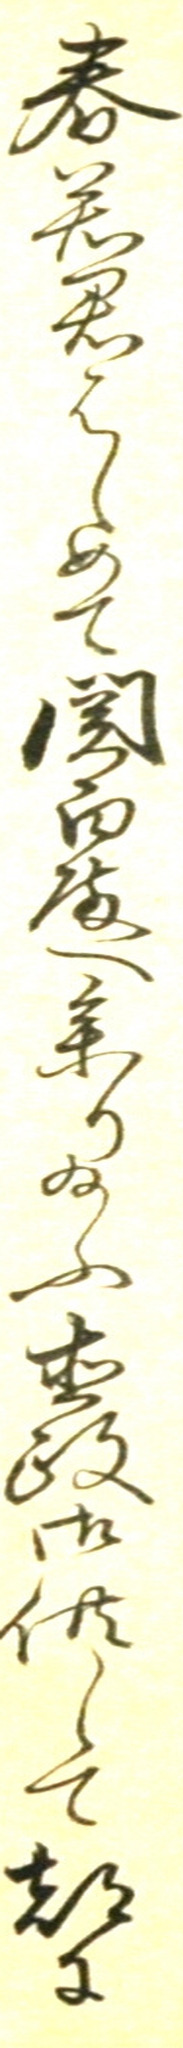春若君はしめて関白殿へ参り給ふ直政御供して都に
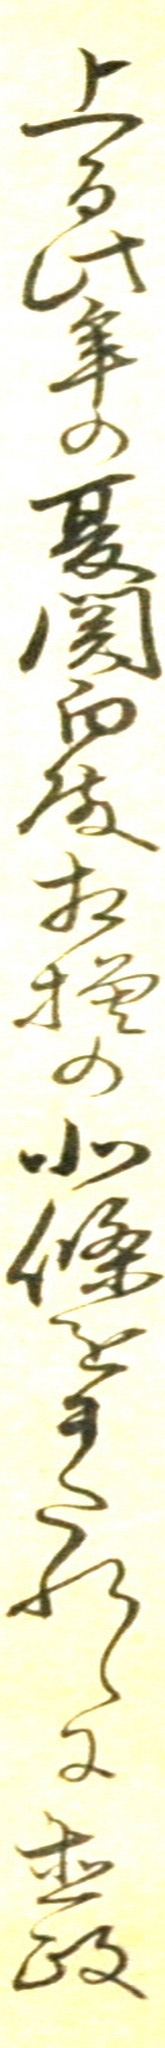上る此年の夏関白殿相模の北条をうたれしに直政

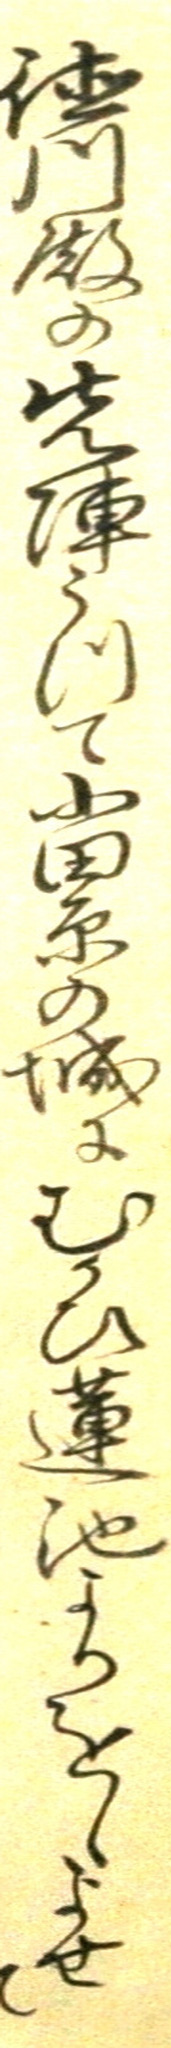徳川殿の先陣うつて小田原の城にむかひ蓮池よりをしよせて
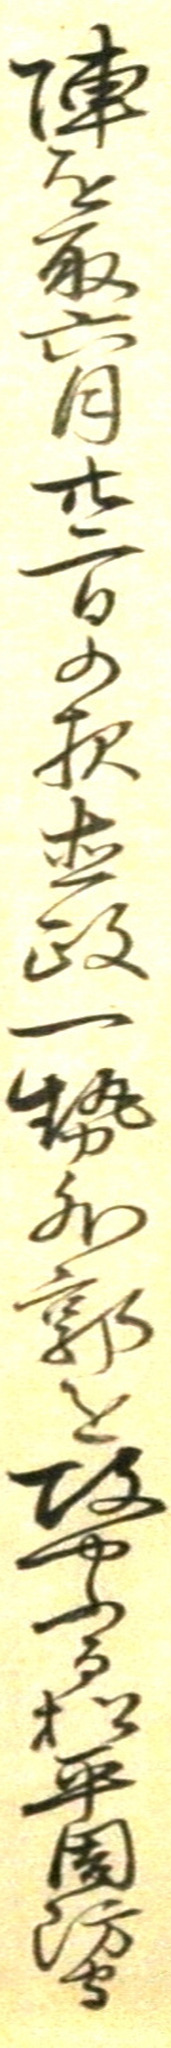陣を取六月廿二日の夜直政一勢外郭を攻やふる松平周防守
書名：藩翰譜（四・上）
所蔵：伊那市立高遠町図書館・合同会社AMANE
